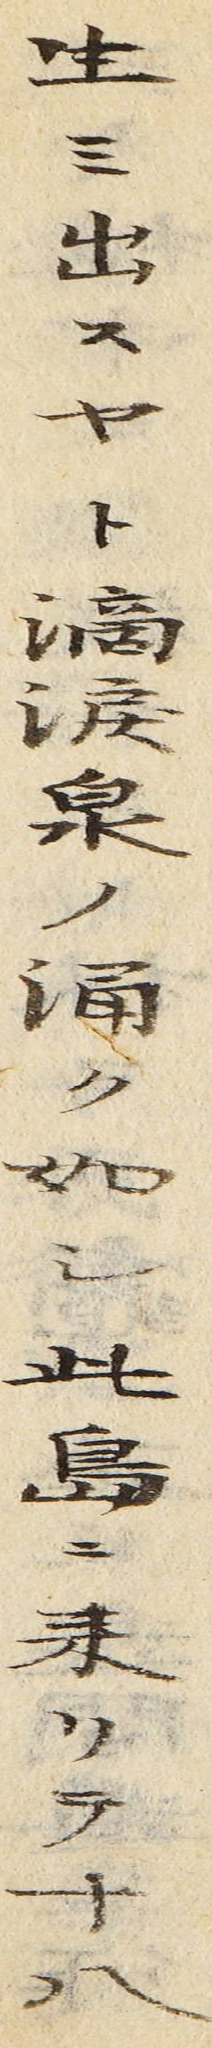生ミ出スヤト滴涙泉ノ涌ク如シ此島ニ来リテ十八
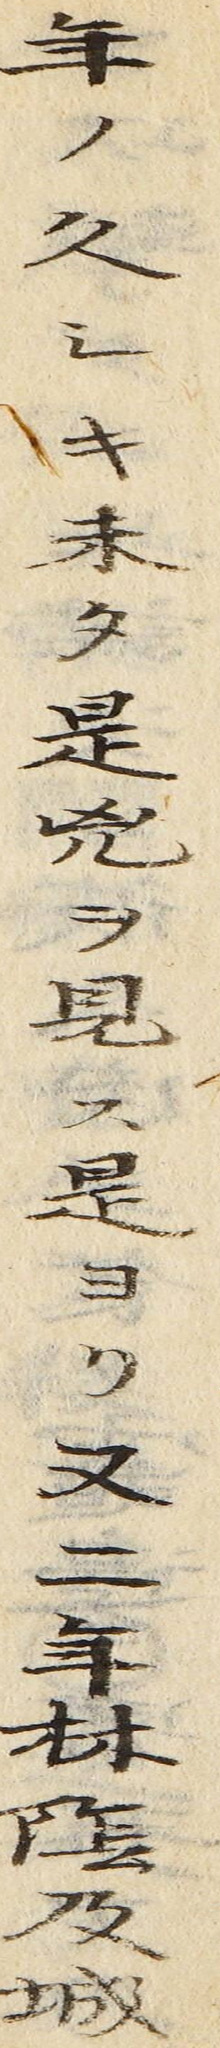年ノ久シキ未タ是兇ヲ見ス是ヨリ又二年林陰及城
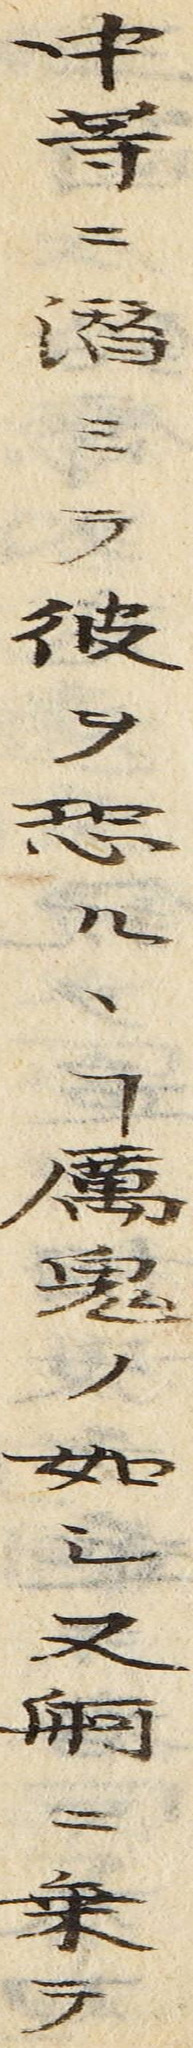中等ニ潜ミテ彼ヲ恐ルヽコト厲鬼ノ如シ又舸ニ乗テ
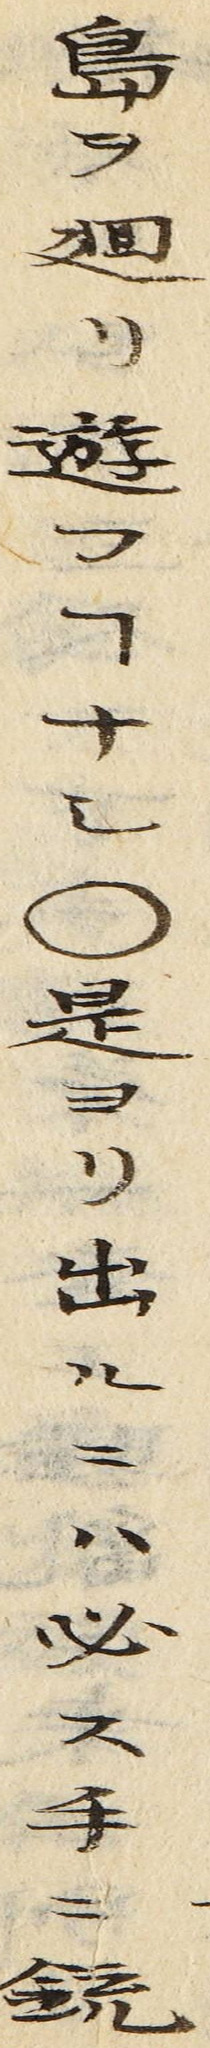島ヲ廻リ遊フコトナシ◯是ヨリ出ルニハ必ス手ニ銃
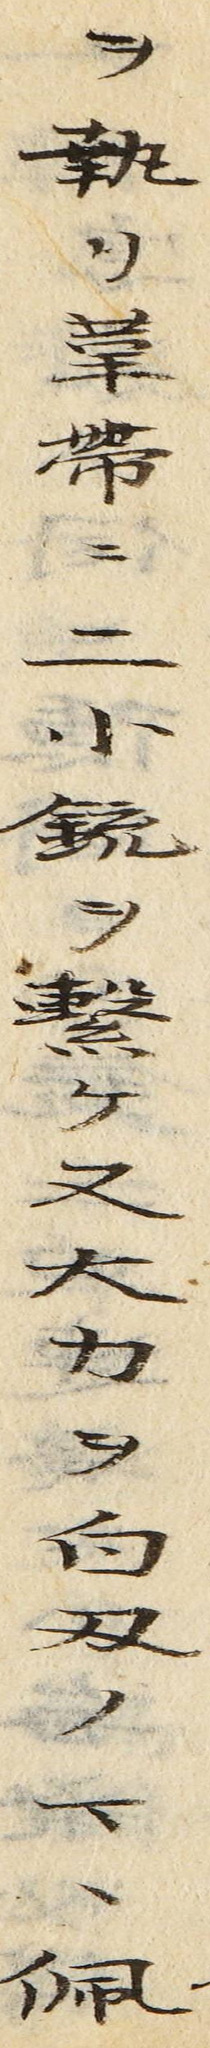ヲ執リ革帯ニ二小銃ヲ繋ケ又大刀ヲ白刃ノマヽ佩
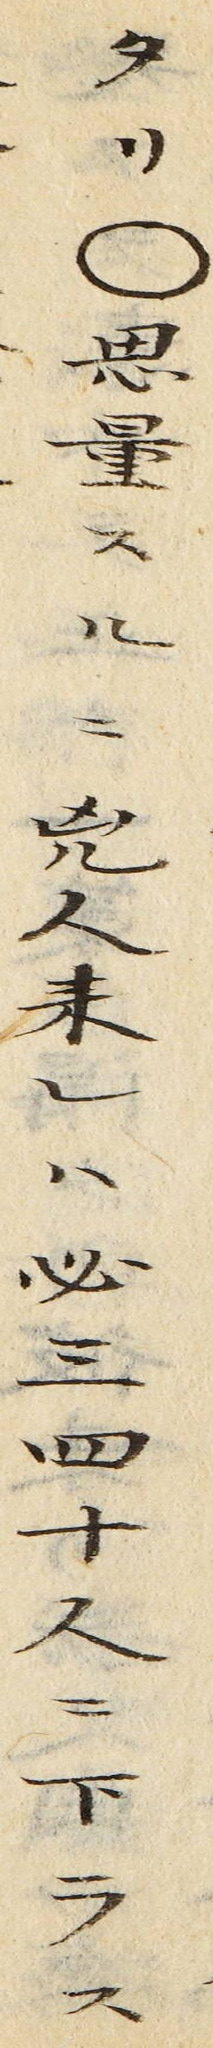タリ◯思量スルニ兇人来レハ必三四十人ニ下ラス
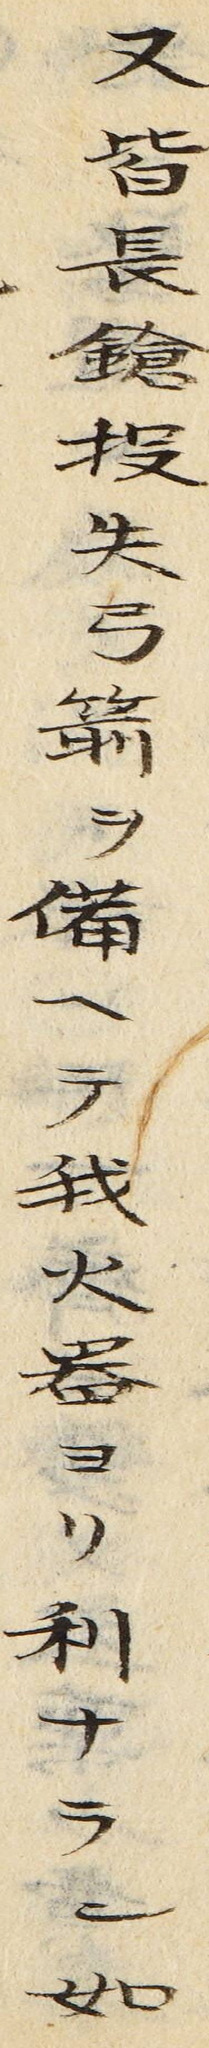又皆長鎗投矢弓箭ヲ備ヘテ我火器ヨリ利ナラン如
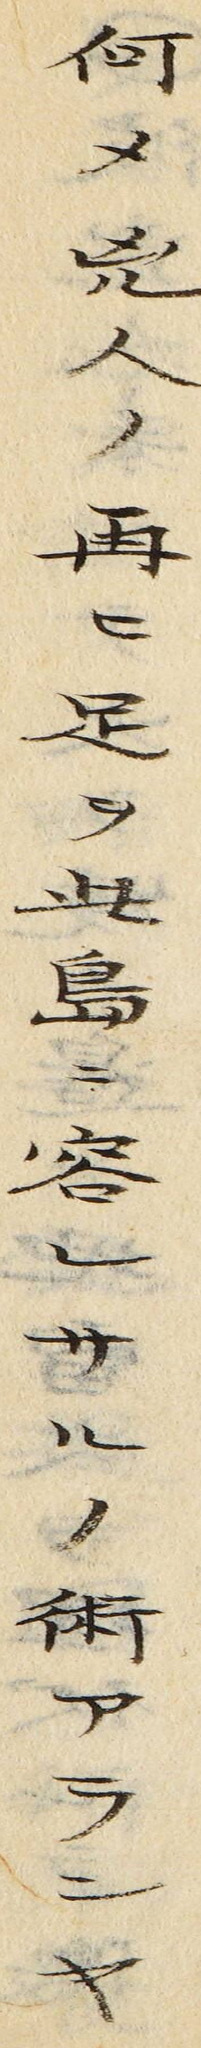何シテ兇人ノ再ヒ足ヲ此島ニ容レサルノ術アランヤ

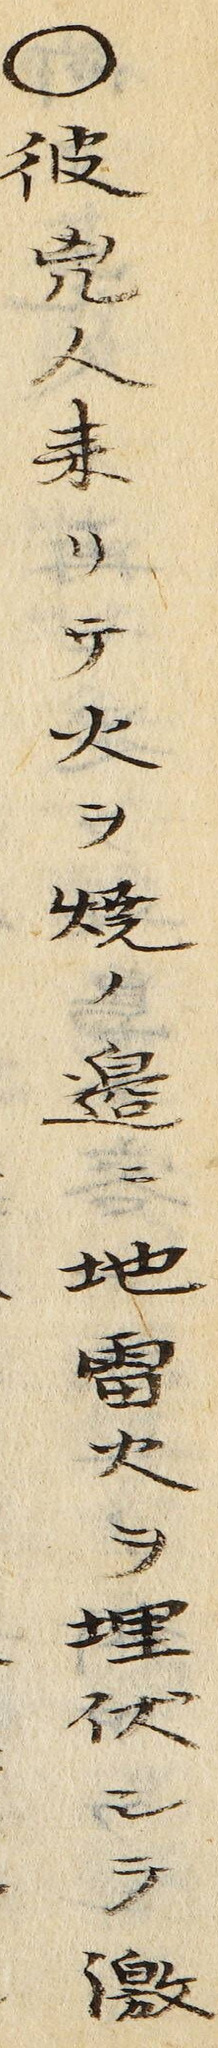◯彼兇人来リテ火ヲ焼ノ辺ニ地雷火ヲ埋伏シテ激
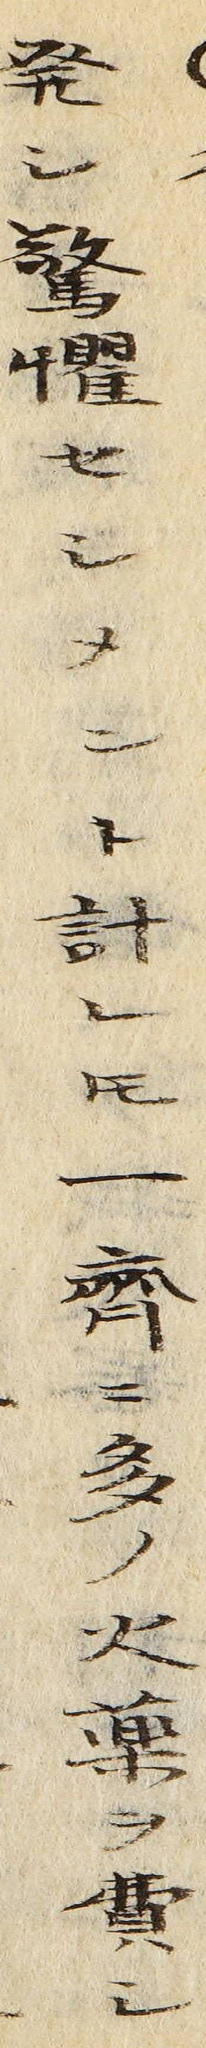発シ驚懼セシメント計レトモ一斉ニ多ノ火薬ヲ費シ
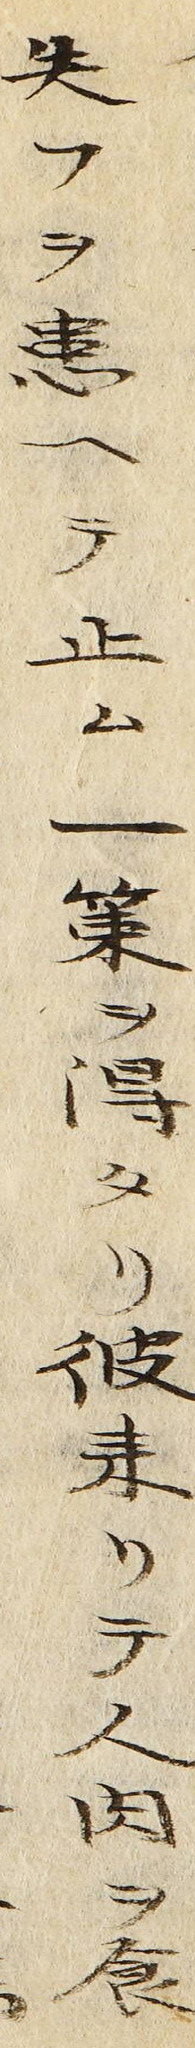失フヲ患ヘテ止ム一策ヲ得タリ彼来リテ人肉ヲ食
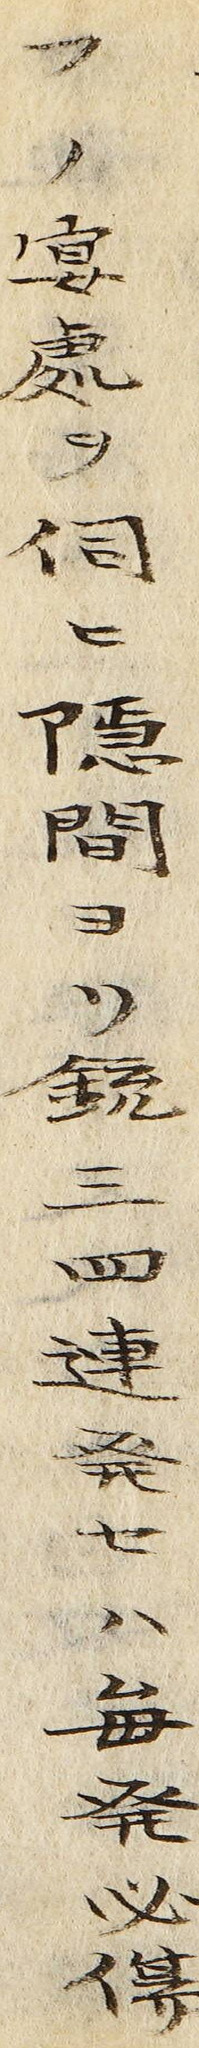フノ宴処ヲ伺ヒ隠間ヨリ銃三四連発セハ毎発必傷
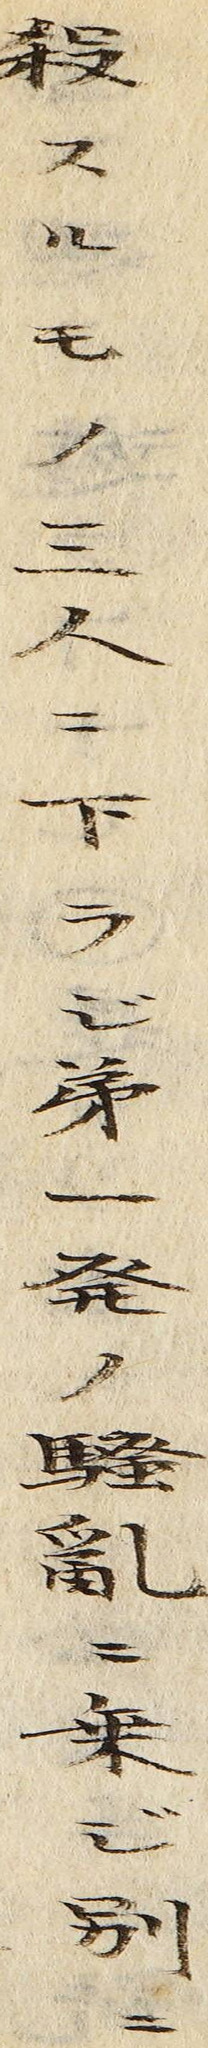殺スルモノ三人ニ下ラジ第一発ノ騒乱ニ乗ジ別ニ
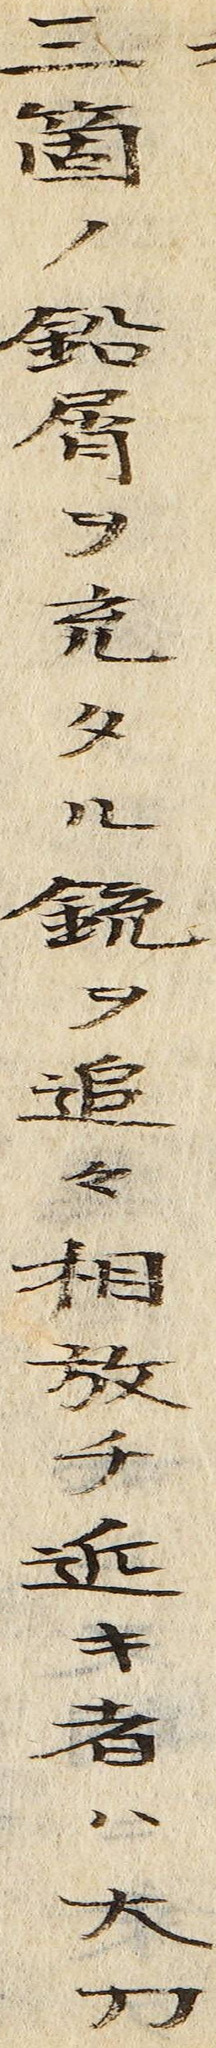三箇ノ鉛屑ヲ充タル銃ヲ追々相放チ近キ者ハ大刀
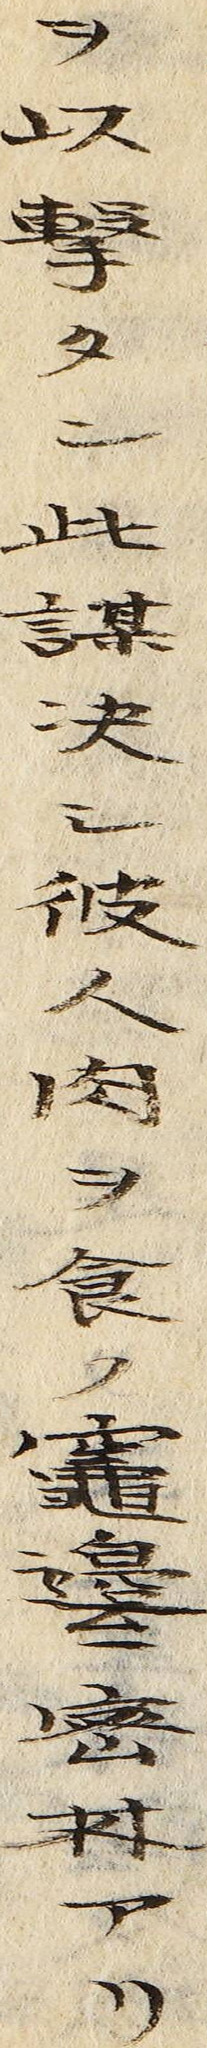ヲ以撃タン此謀決シ彼人肉ヲ食ノ竈辺ニ密林アリ
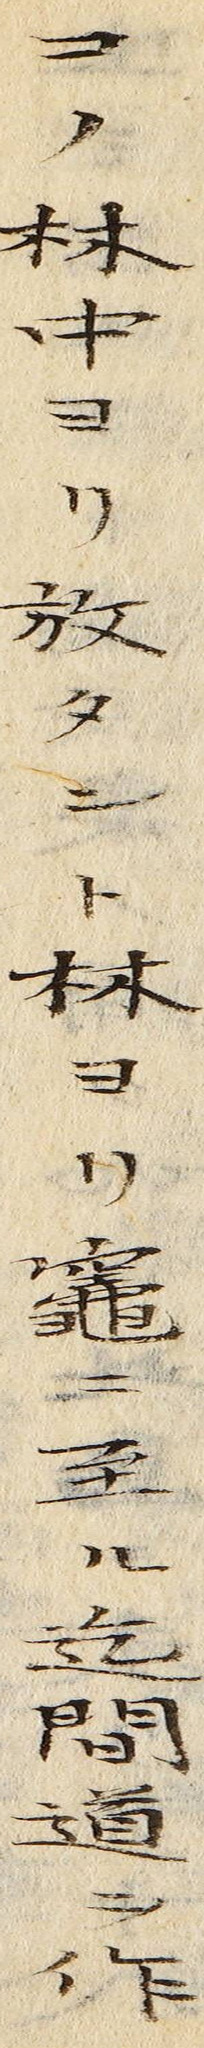コノ林中ヨリ放タント林ヨリ竈ニ至ル迄間道に作
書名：漂流紀事
